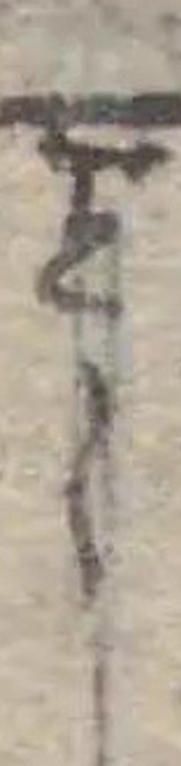ごとし
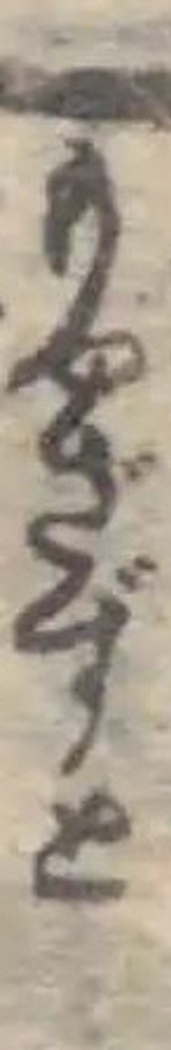もやざずと
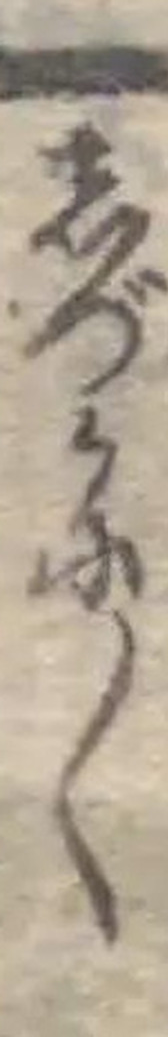しづかに〳〵
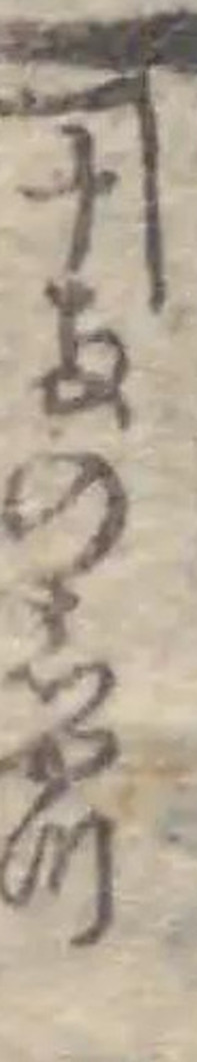〽十両のしやつ
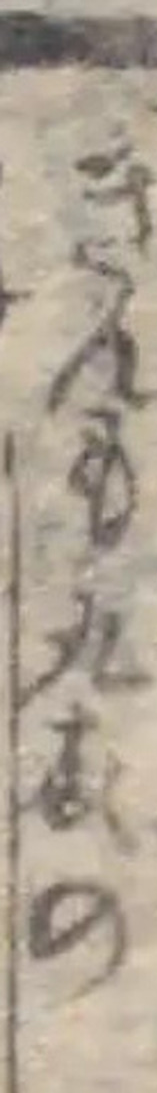きんも九両の
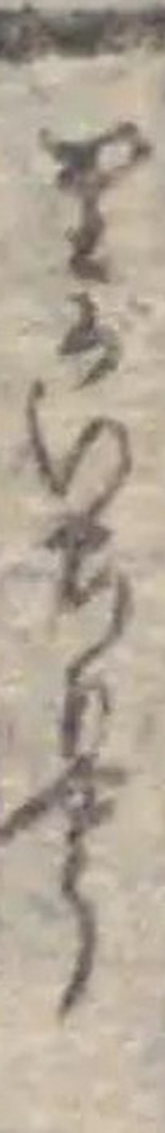りがいちりやう

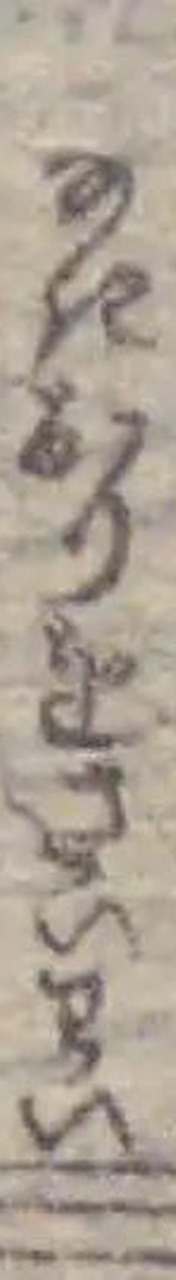なきおりをさいわい
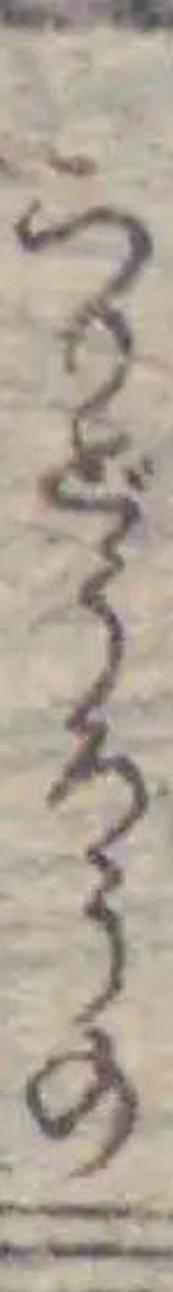つりどうろうの
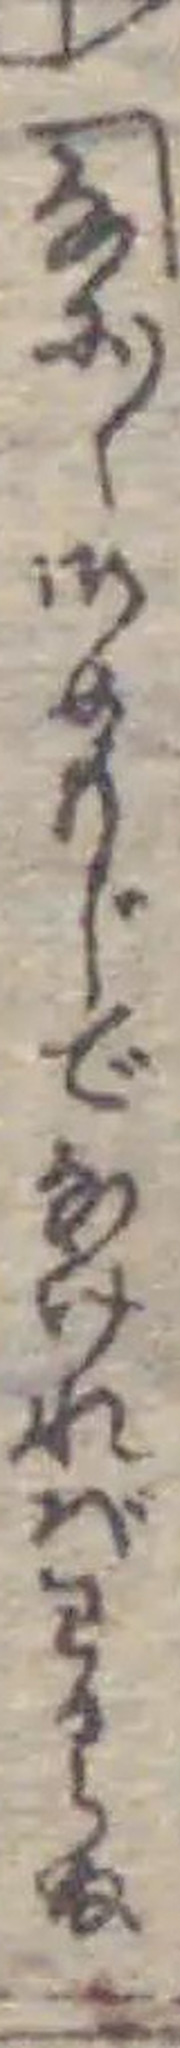〽なに〳〵御めもじでなければわからぬ
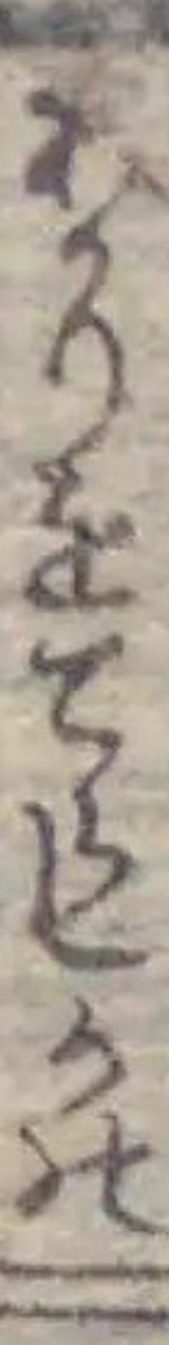あかりをてらしかの
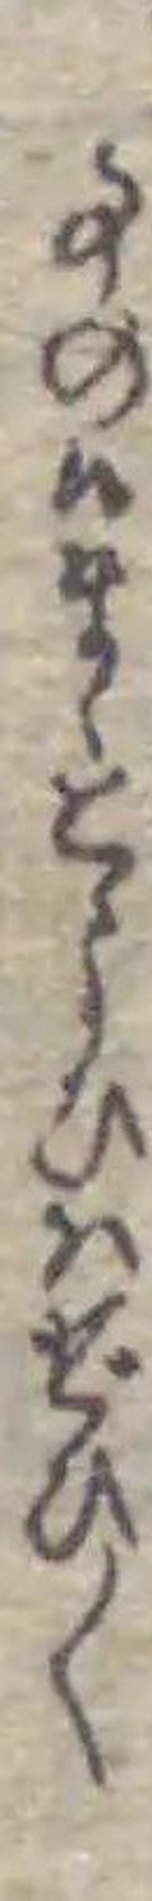事の候まゝこよひはぜひ〳〵
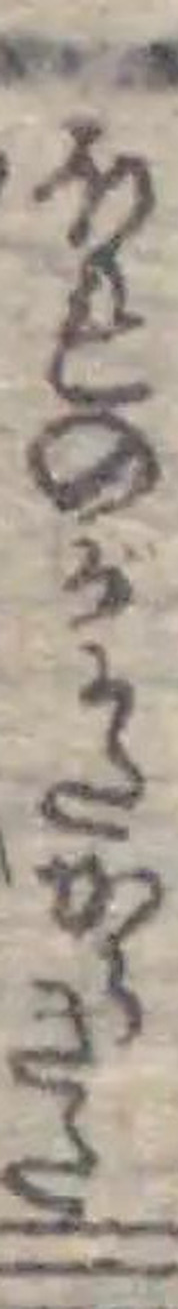ほれのがかたからきた
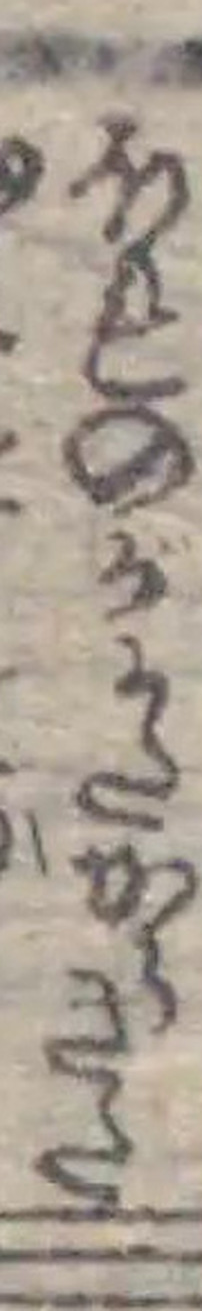ほれのがかたからきた
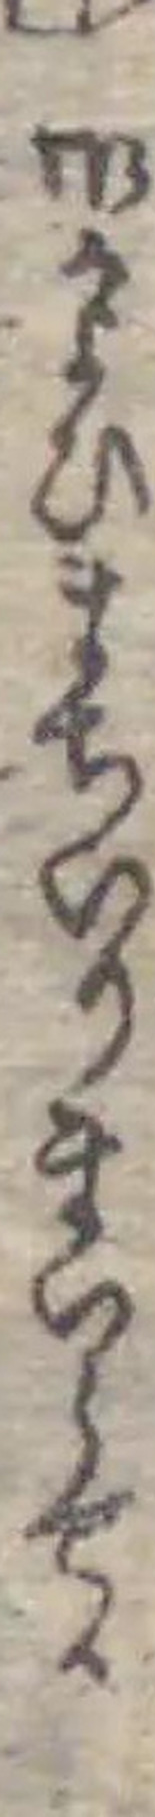御かよひまちいりまいらせ候
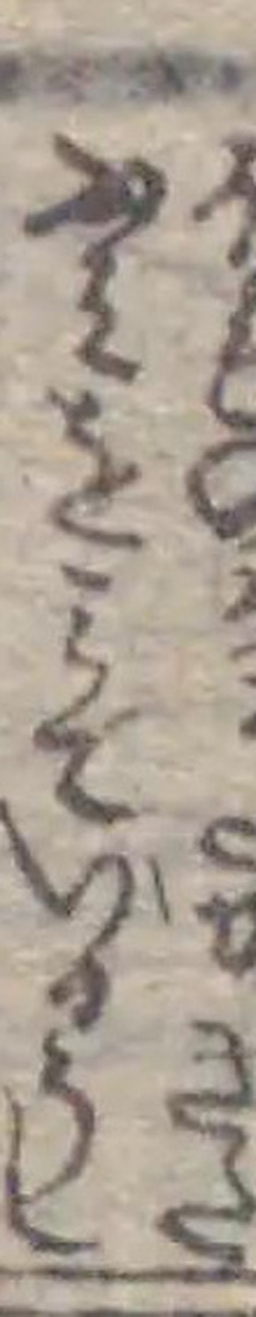ふみをみているうし
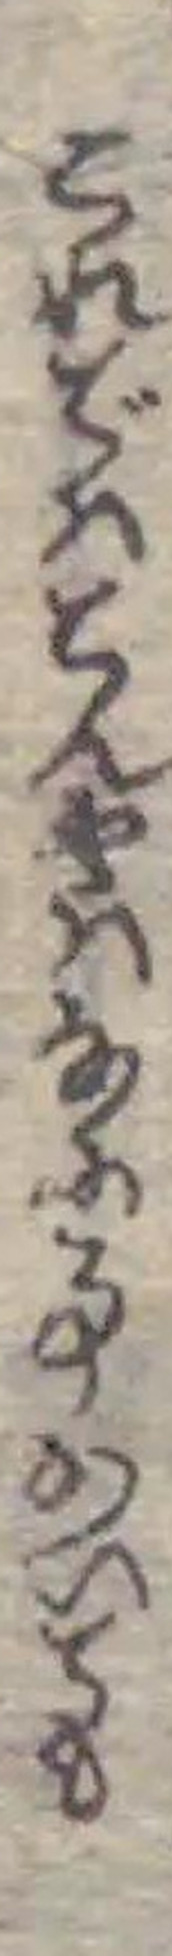これではこんやはなに事かいても
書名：福壽海旡量品玉 3巻
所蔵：国立国会図書館 National Diet Library, JAPAN
